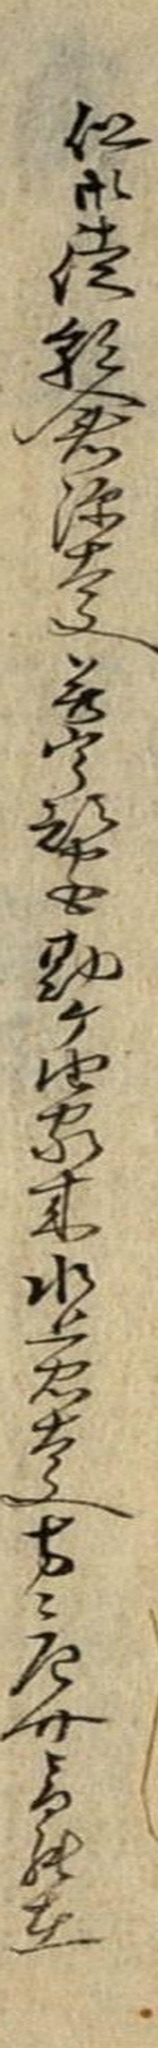但御徒朝倉源太夫并宇都宮勘解ケ由家来水上忠太夫方に厄介に而罷在
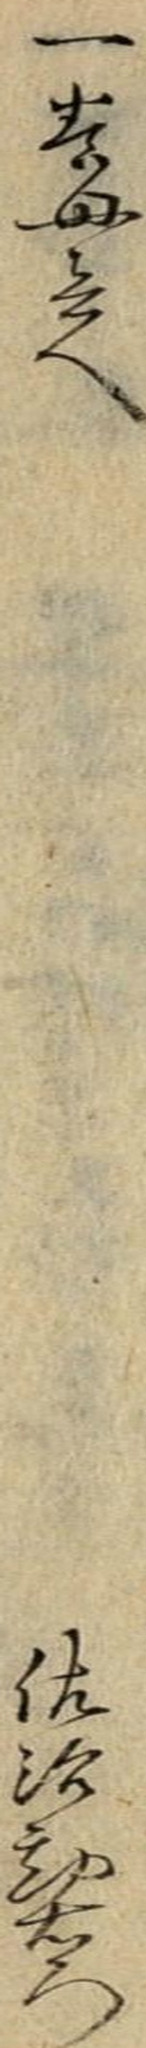一養母壱人佐治勘右衛門
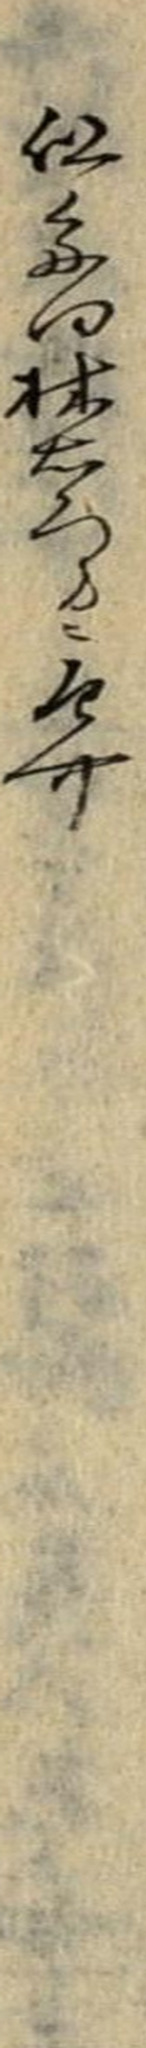但多田林右衛門方に厄介
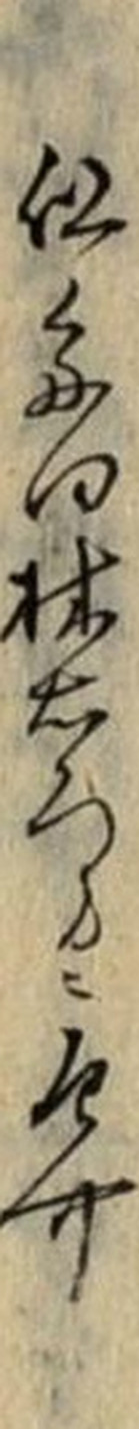但多田林右衛門方に厄介
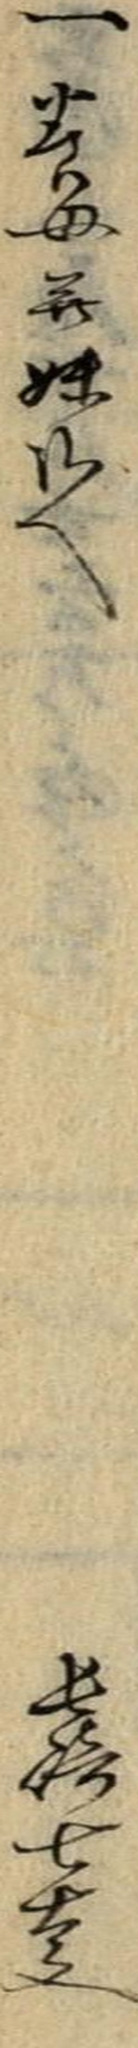一養母并妹弐人長崎七太夫
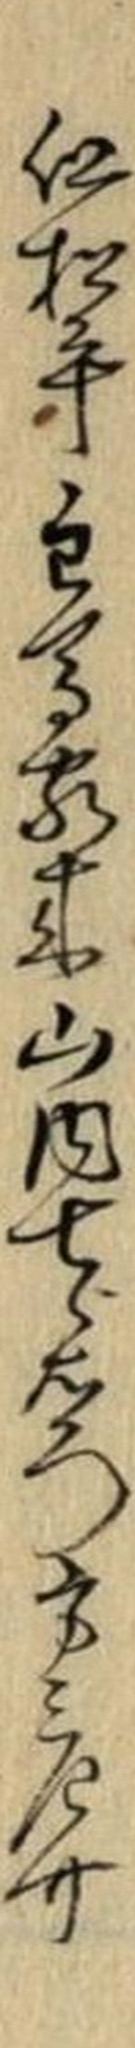但松平主馬家来山内七郎右衛門方に厄介
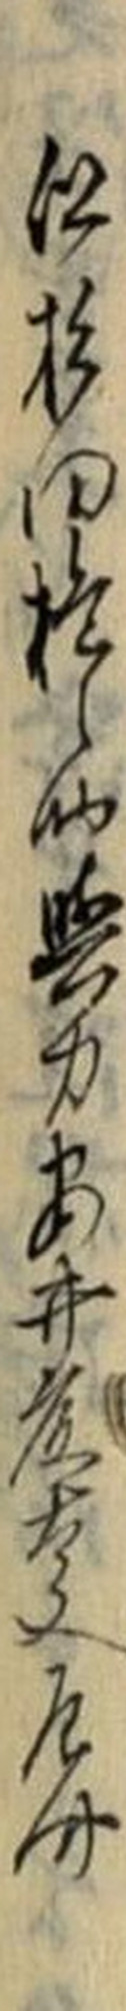但杉田権之助与力安井藤太夫厄介
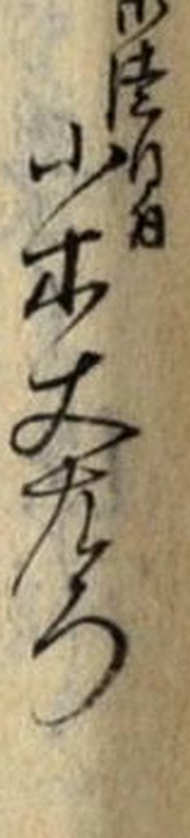小木丈左衛門
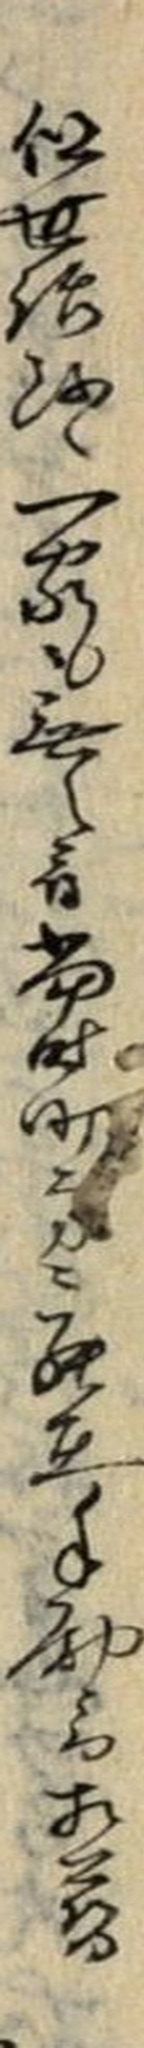但世話致候一家も無之に付当時町方に罷在手助に而相暮
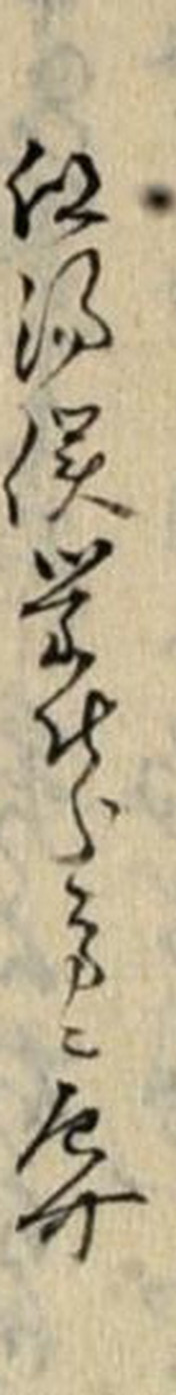但湯俣栄次郎方に厄介
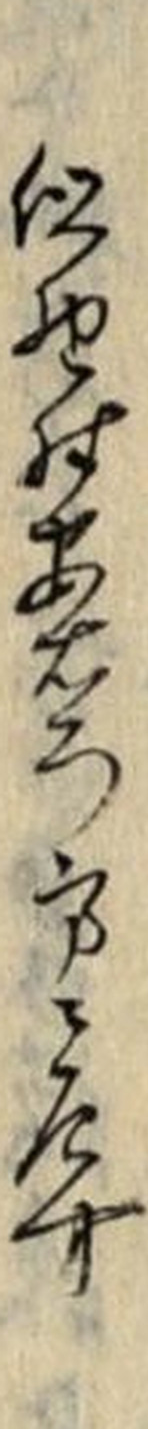但野村安右衛門方に厄介
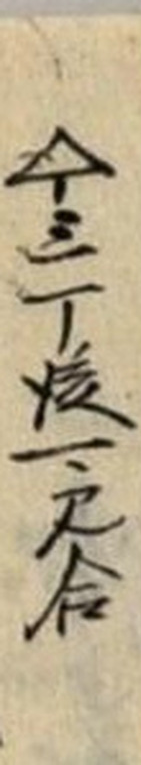仐三丁後可見合
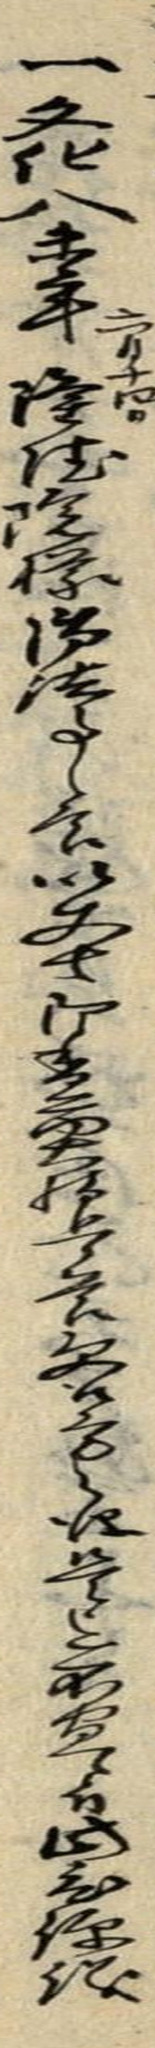一文化八未年六月十四日隆徳院様御法事之節御使者御香奠指上候節受取方之儀是迄不宜候付此度評議
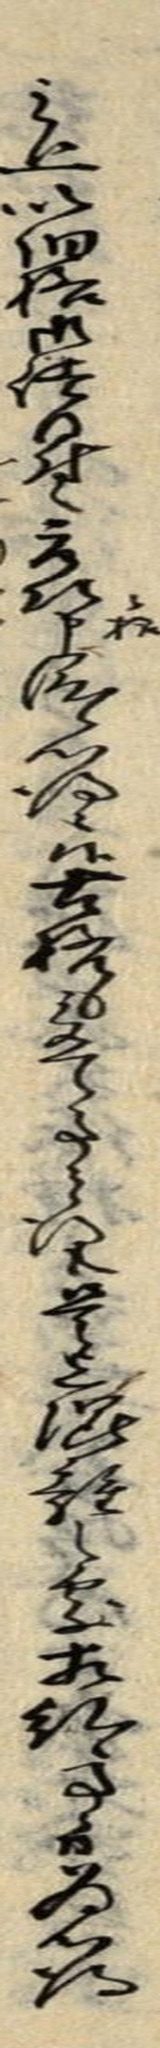之上以旧格御徒目付へ取次候様申渡候心得に候古格も有之事に候得共是迄混雑之処相糺候事に付為心得
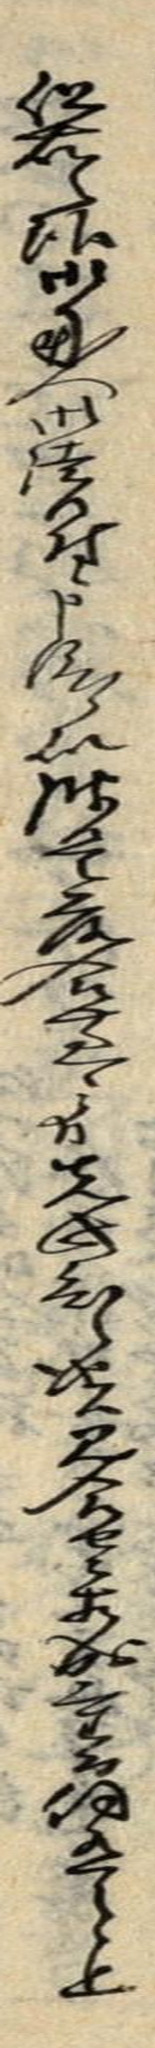但右之趣御用人御徒目付へ申渡候処彼是落合兼候に付先此度之儀見合せに相成重而伺有之候上
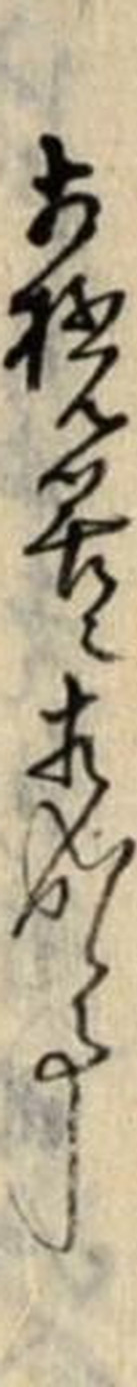相極る筈に相成候事
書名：蒐輯之部
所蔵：福井県文書館 Fukui Prefectural Archives
